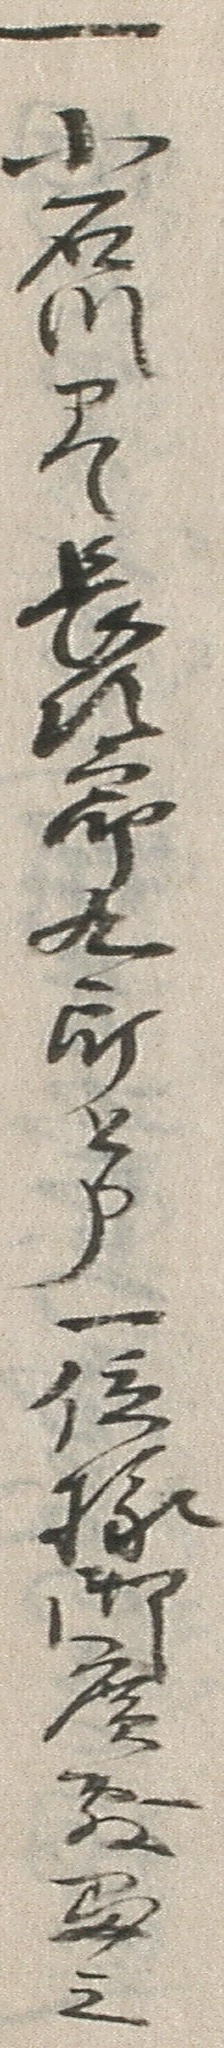一小石川まて長次郎九郎と申一位様御廣敷番之
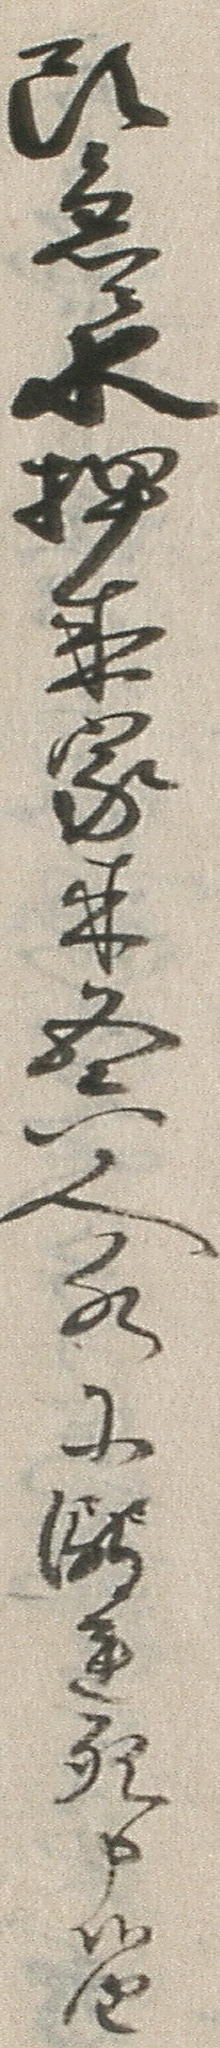頭急に水押来家来五六人水に溺れ死申候由
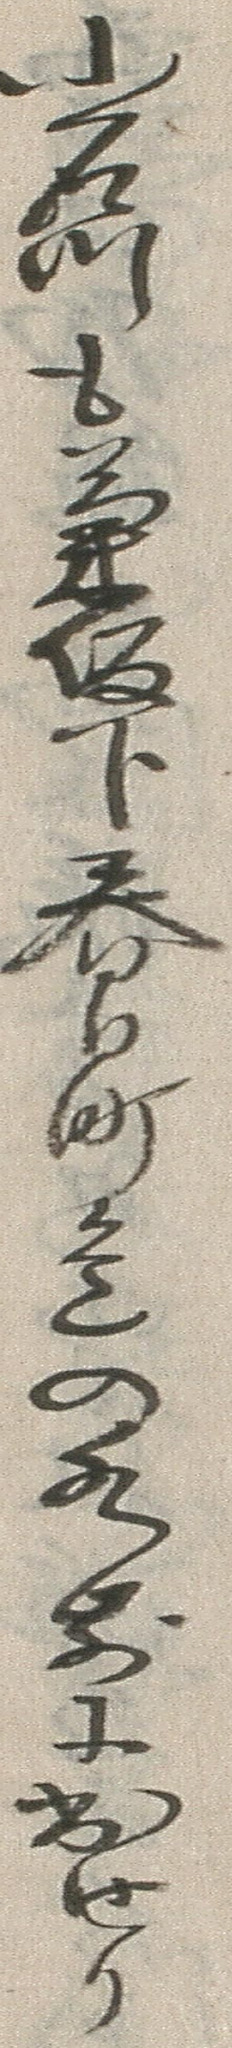小石川も菊坂下春日町辺の水前に出せり
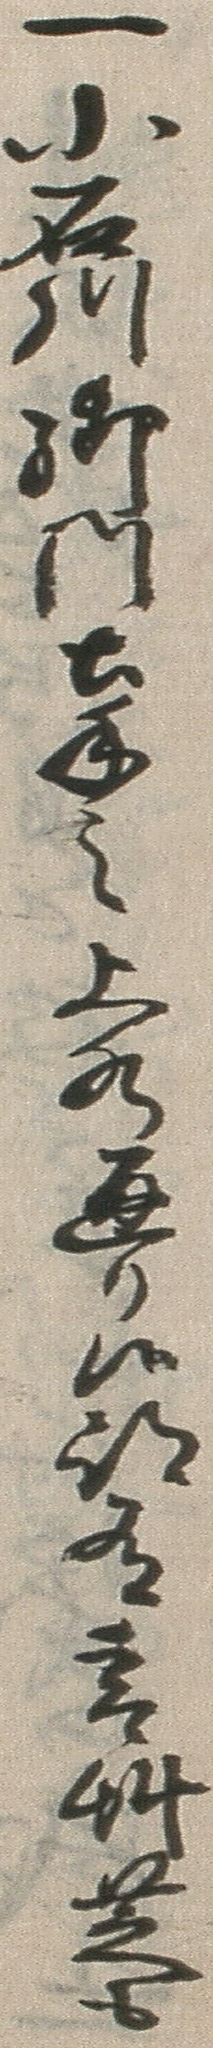一小石川御門土手之上水通り候跡有青竹芝も
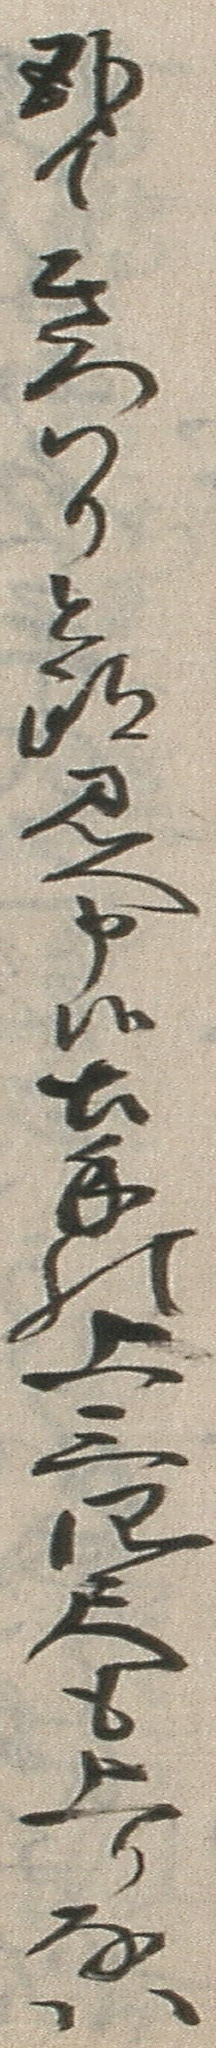外にきつはりと跡見へ申候土手の上三四尺も上りなは
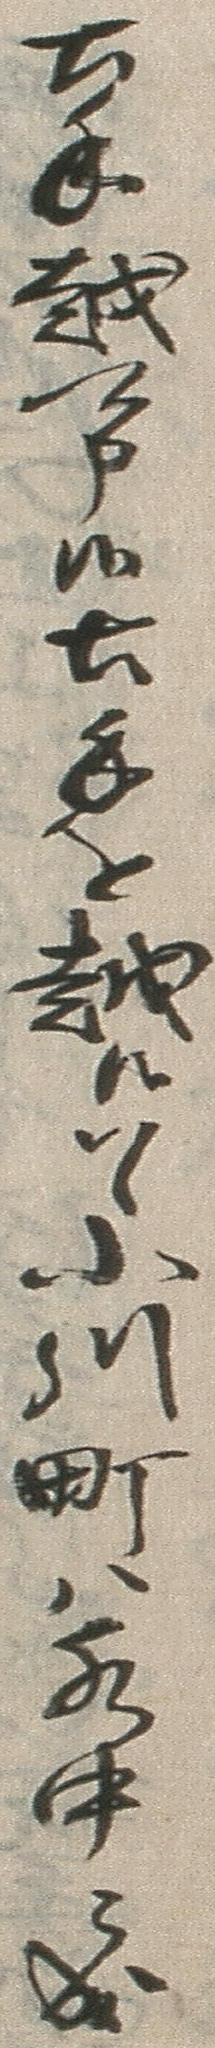土手越可申候土手を越候ハヽ小川町は水中に成
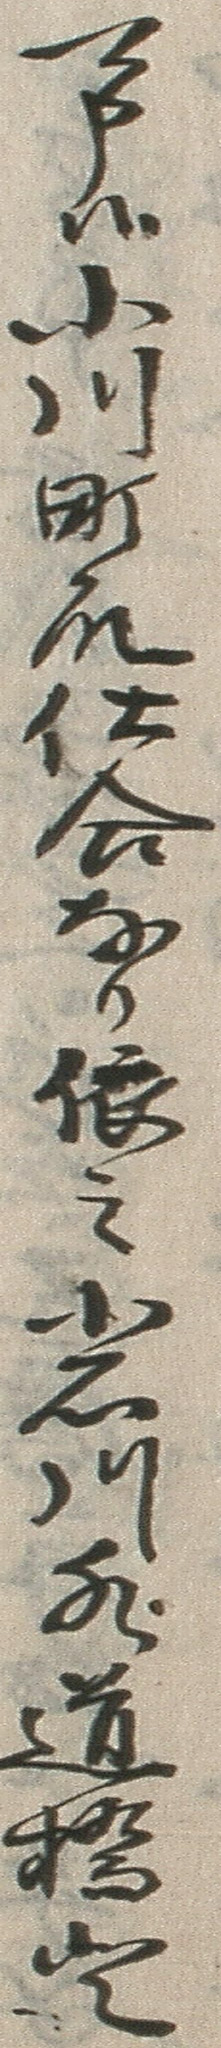可申候小川町衆仕合なり依之小石川水道橋と
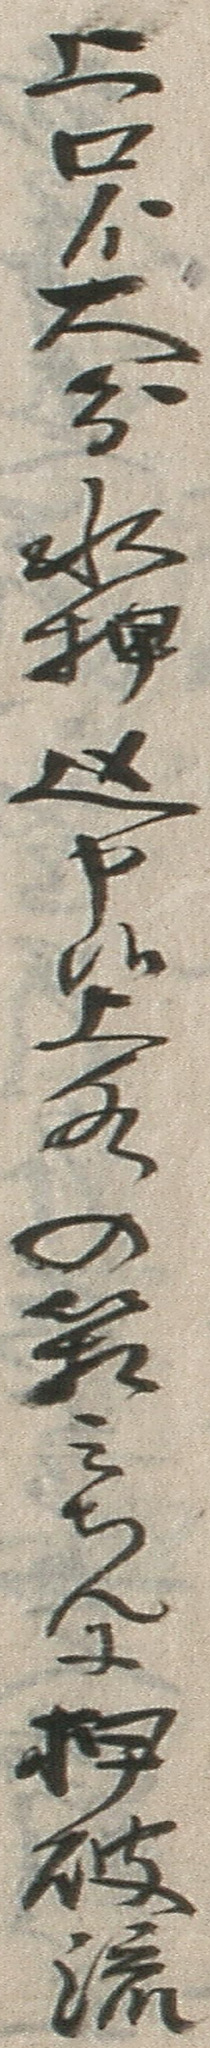上口ゟ大分水押込申候上水の箱みちんに押破流
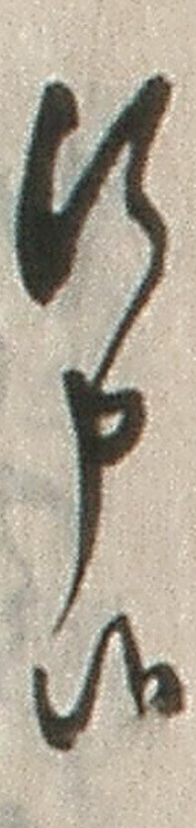行申候
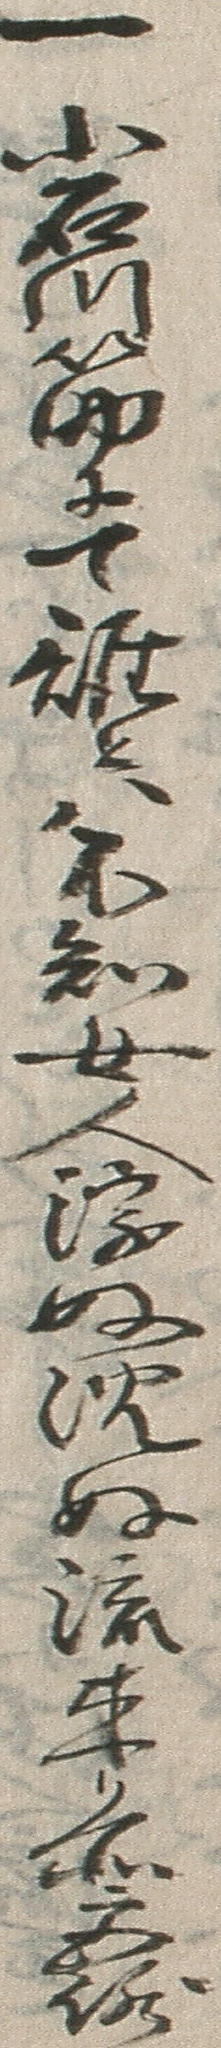一小石川筋にて誰とは不知女人浮ぬ沈ぬ流来り所宮崎
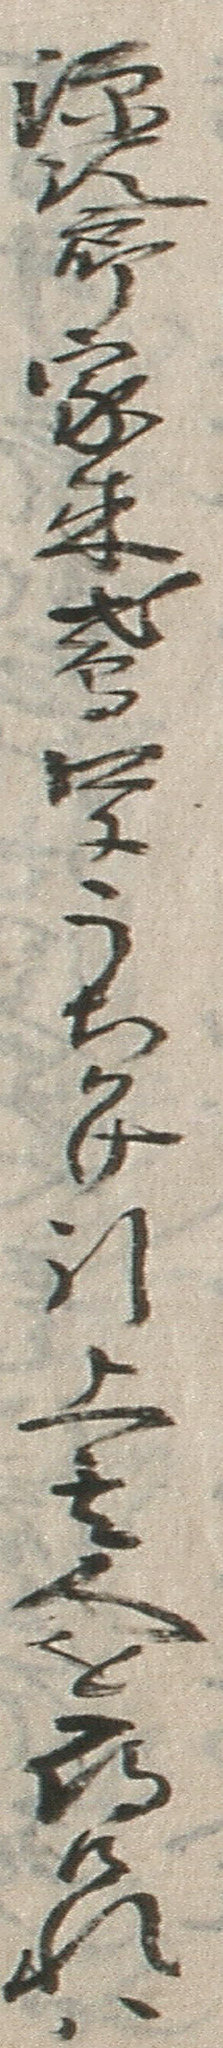源次郎家来鳶口にうちかけ引上其人を尋けれは
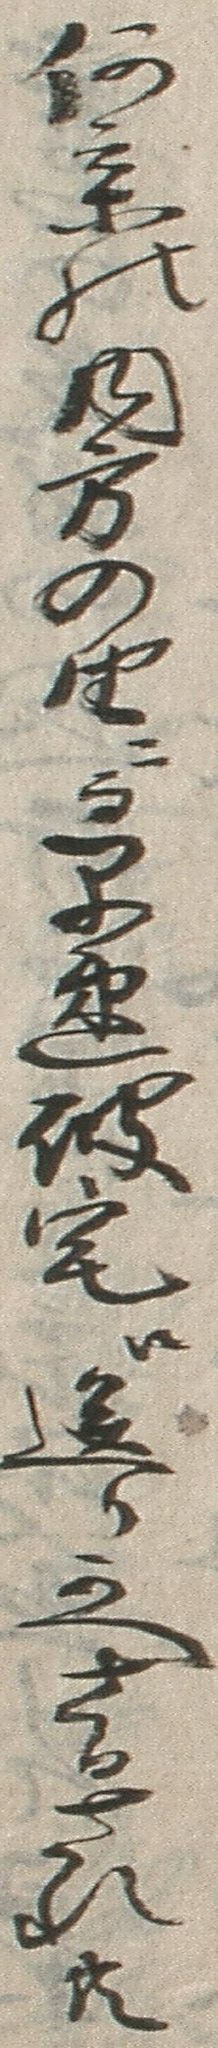何某の内方の由にて早速彼宅江送りかへさるされ共

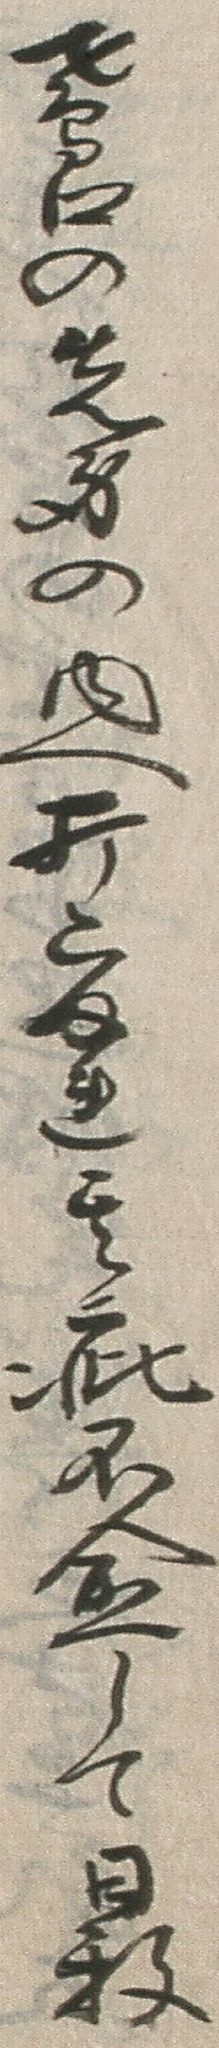鳶口の先身の内へ打こまれ其疵不愈して日数
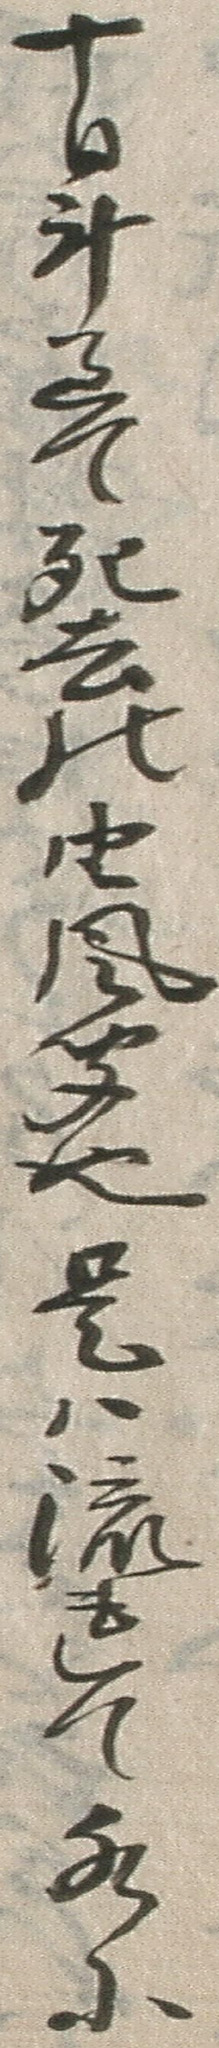十日計過て死去の由風聞也是は流れて水に
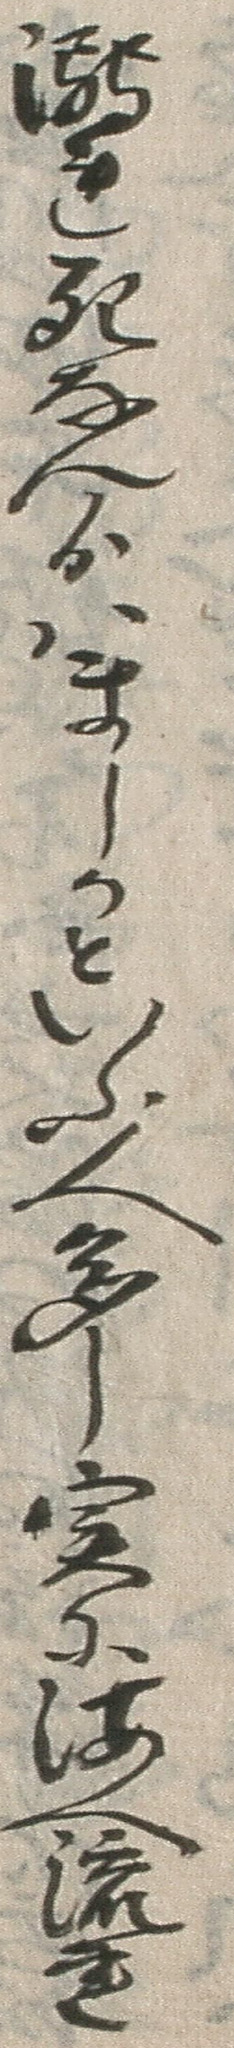溺れ死なんゟはましかといふ人多し実に海へ流れ
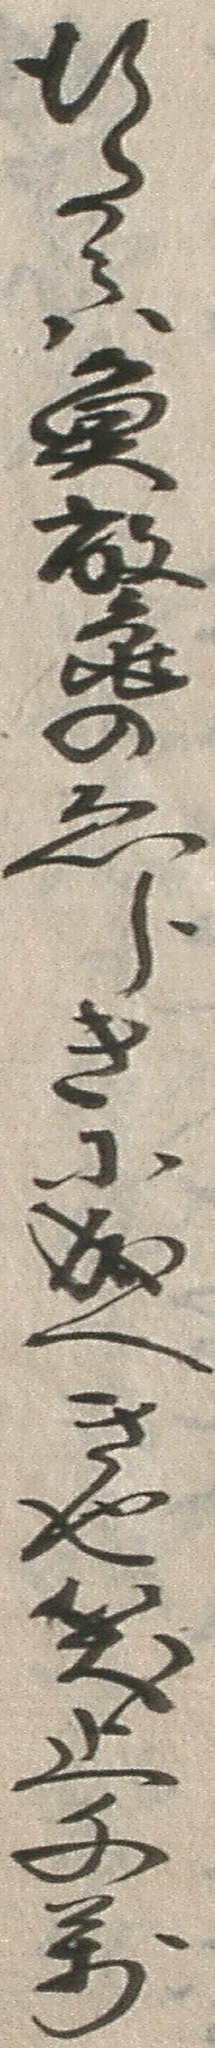行たるは魚鼈のゑじきに成へき也笑止千万
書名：享保十三年江戸洪水記
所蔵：東京大学地震研究所図書室 Earthquake Research Institute Library, The University of Tokyo, JAPAN
